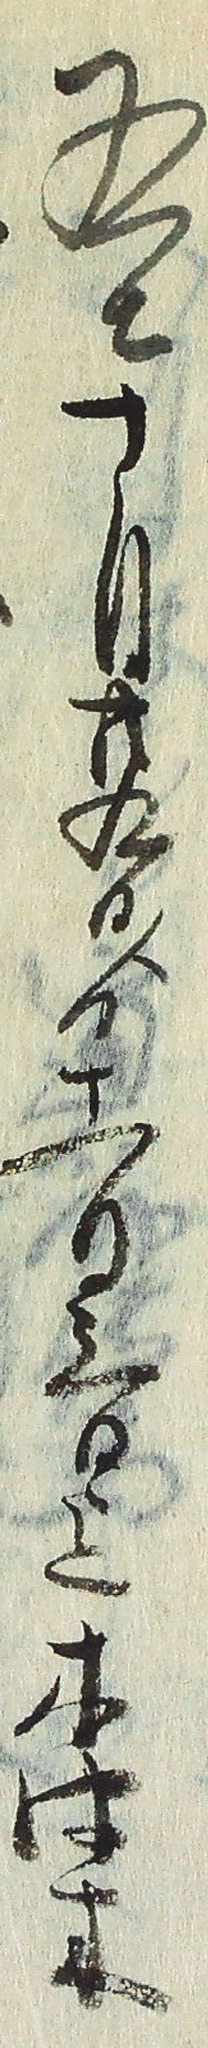右は十月廿九日ゟ十一月三日迄木津木
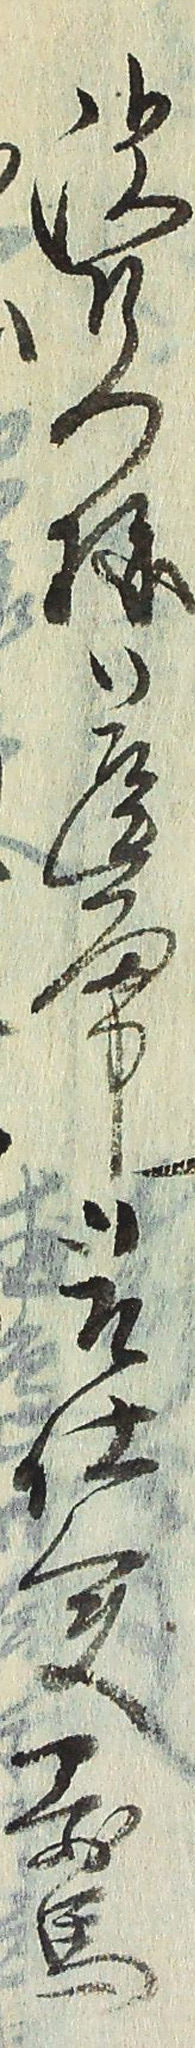次左衛門様御逗留中御召仕人夫寄馬
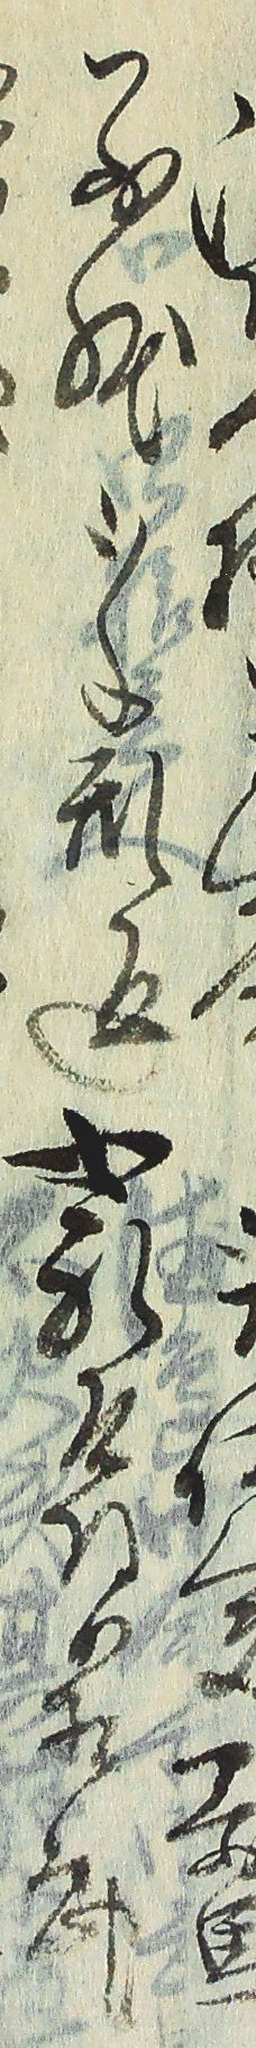別紙御手形通北新居村ゟ相当
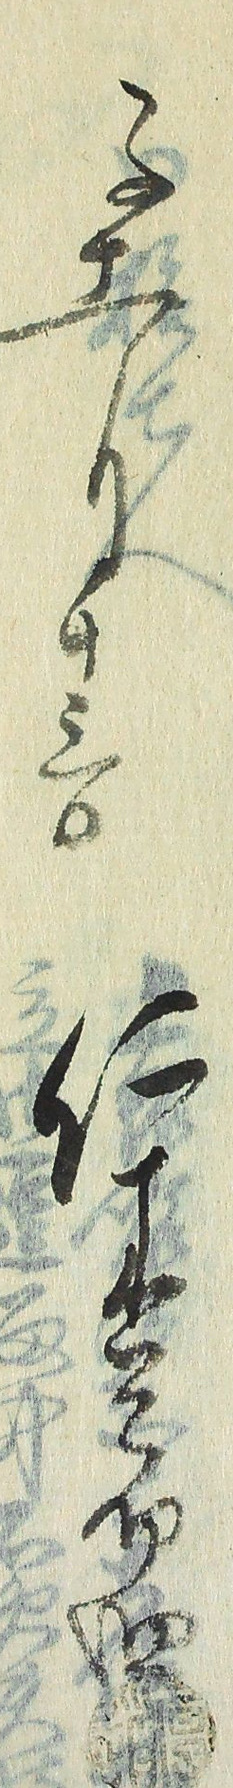子十一月十三日仁木節助
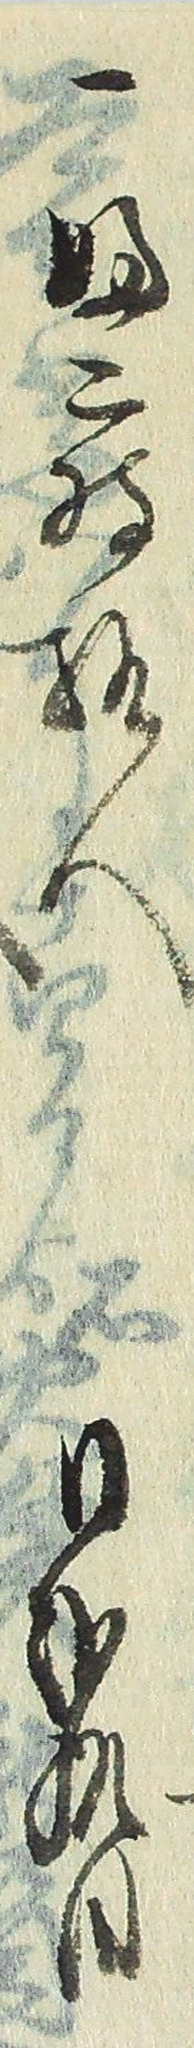一ふこ持拾人同弐拾目
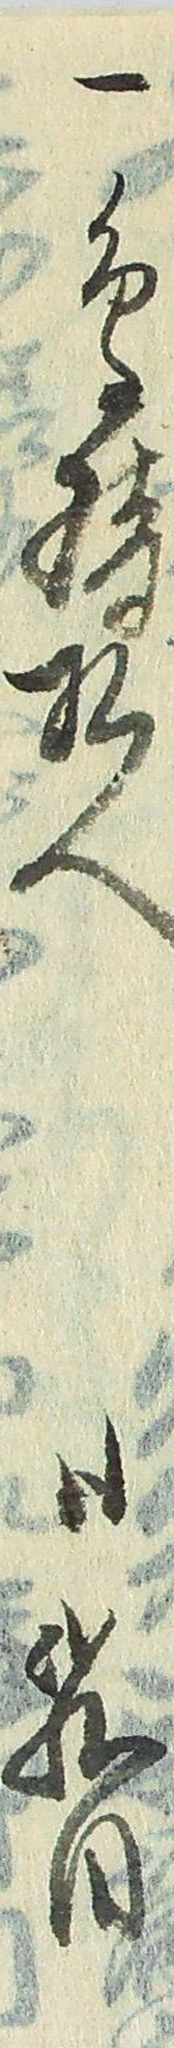一鳥持拾人同弐拾目
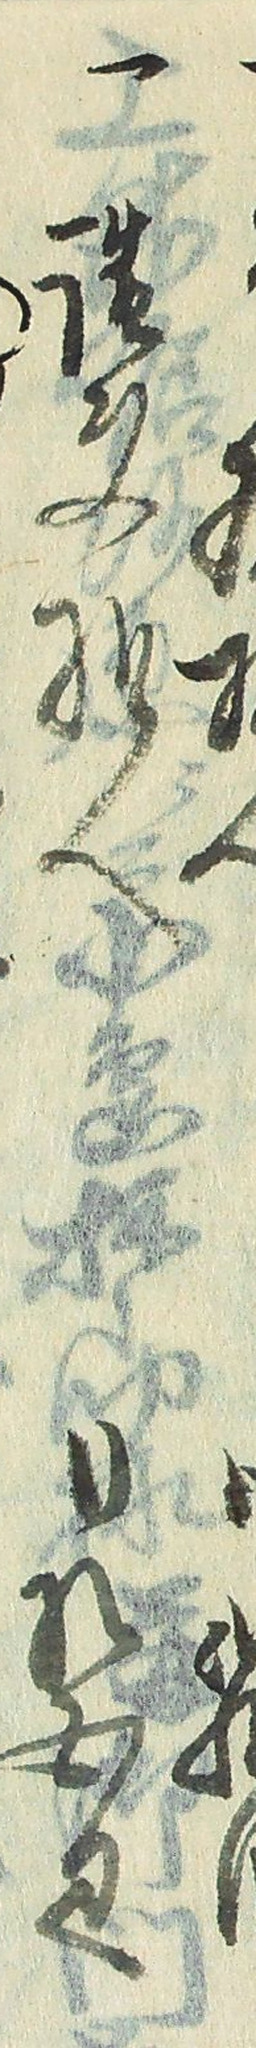一詰夫拾人同拾五匁
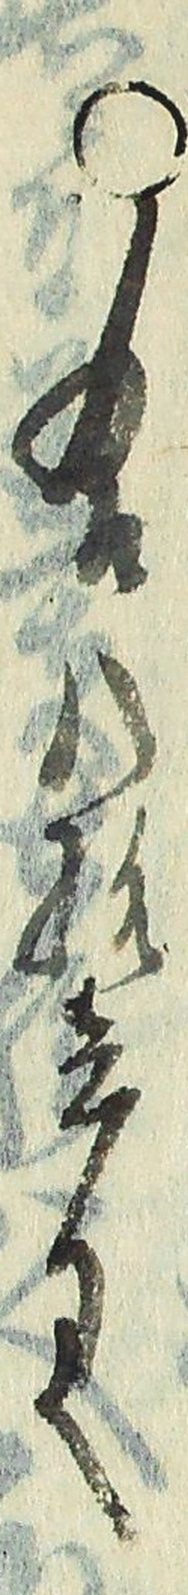合八拾壱匁
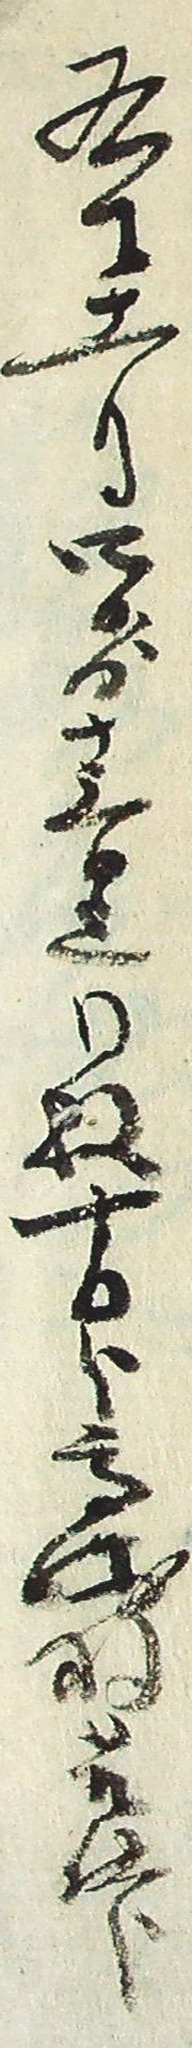右は十一月四日ゟ十三日迄日数十日分高崎村召仕分

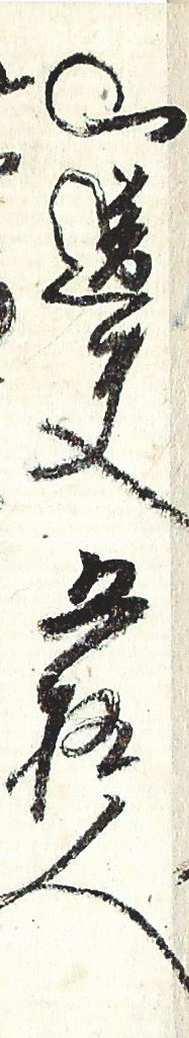一送夫五拾人
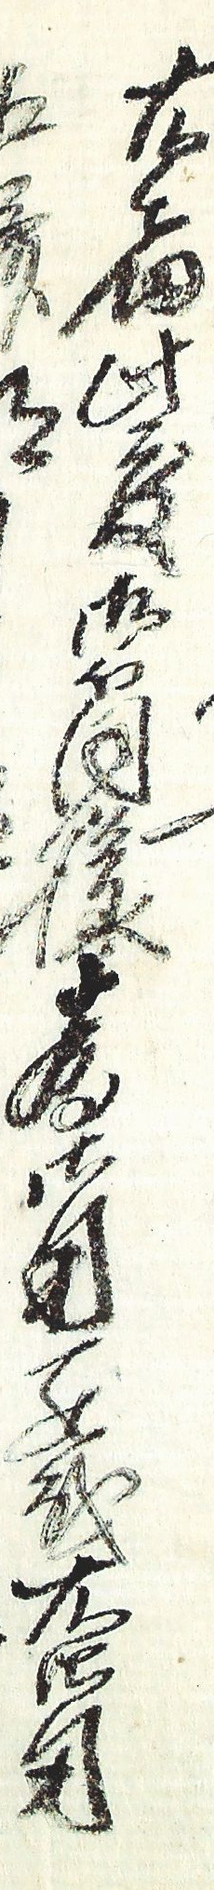右は此度御筒様為御用罷越尤御用
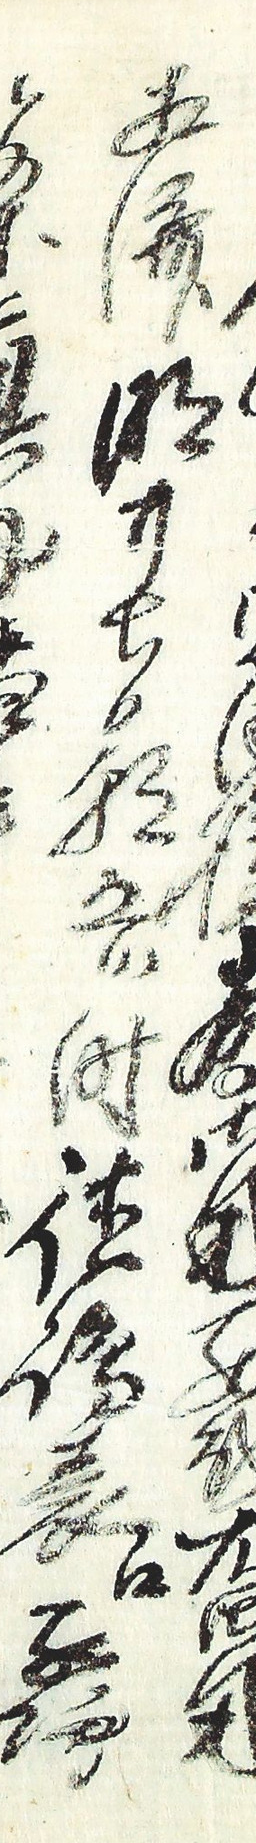相済明廿七日朝五つ時徳島表え罷帰り
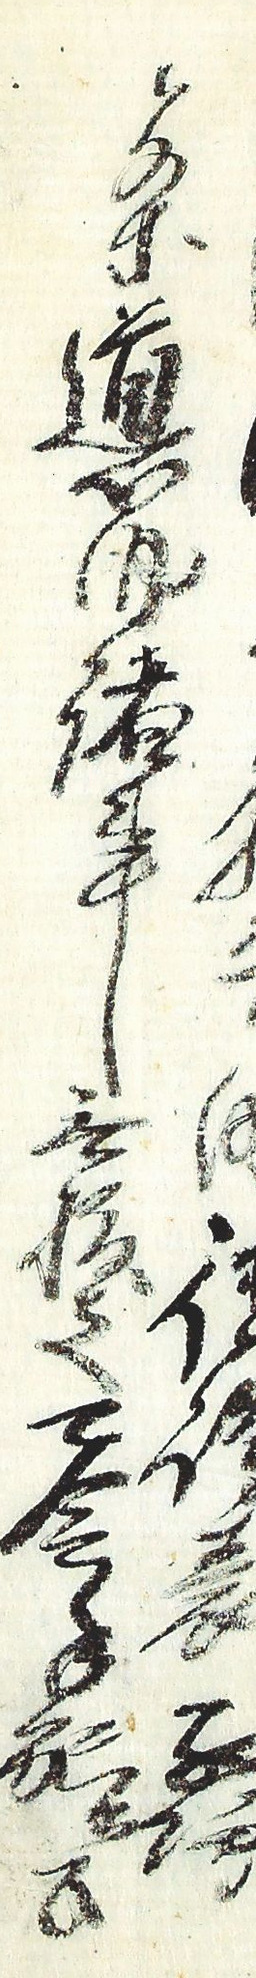候条道筋諸事無指支可令手配候以上
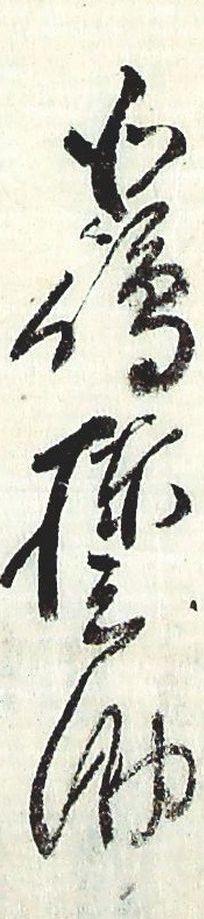北島棟之助

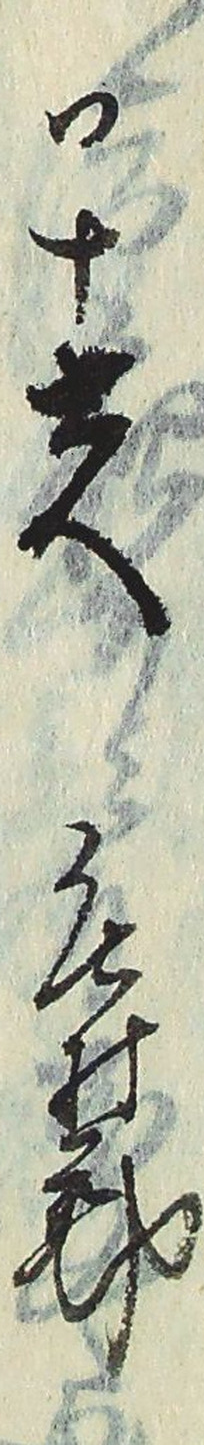同十六人庄村勤
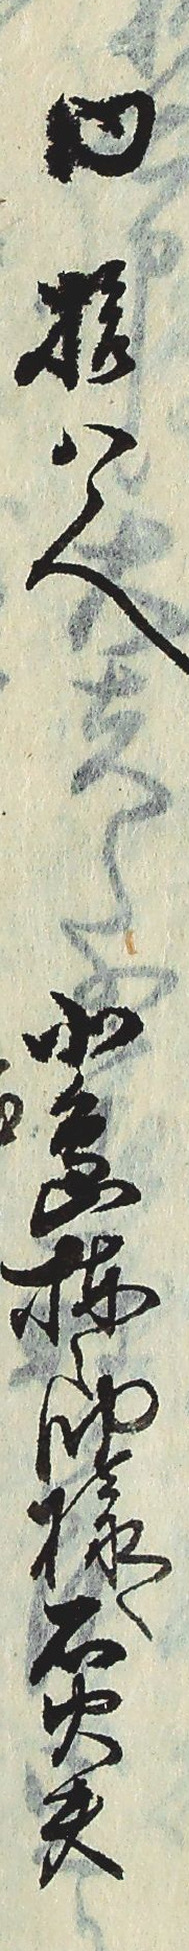内拾八人北島棟助様石火矢
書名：名東郡中諸割賦元帳
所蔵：鳴門教育大学 Naruto University of Education
